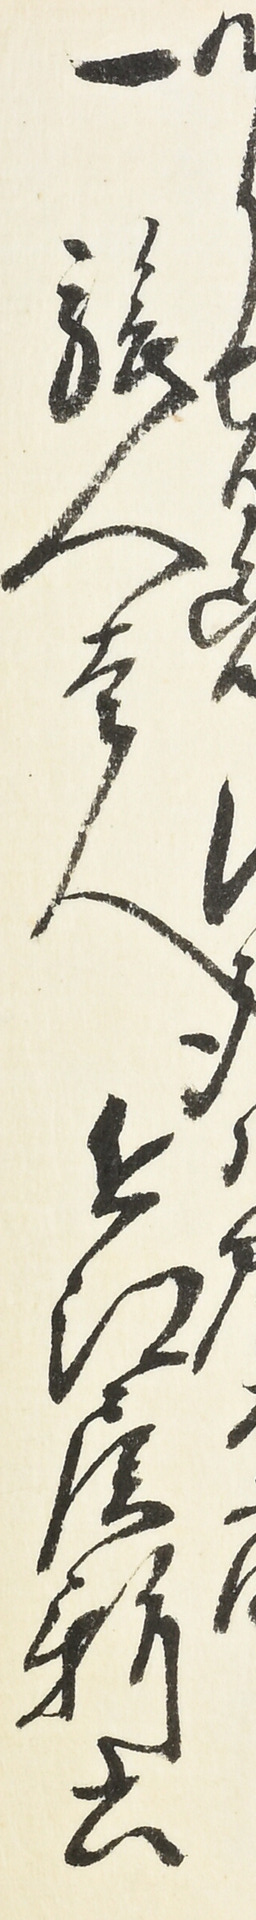一旅人壱人近江屋新六
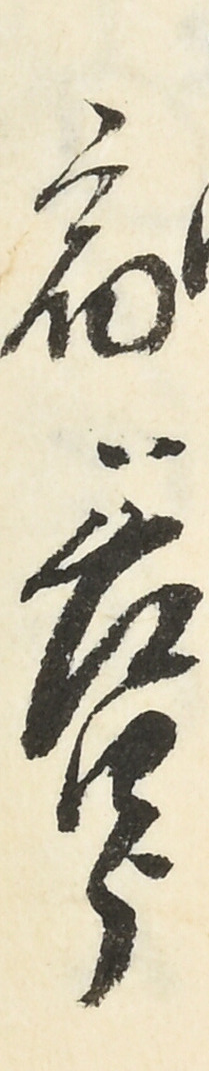宿善四郎
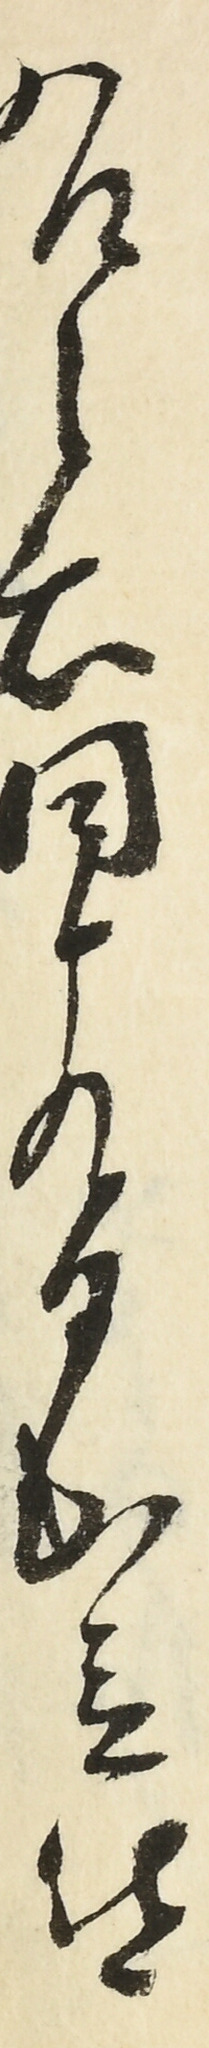右之者同十三日出立仕候

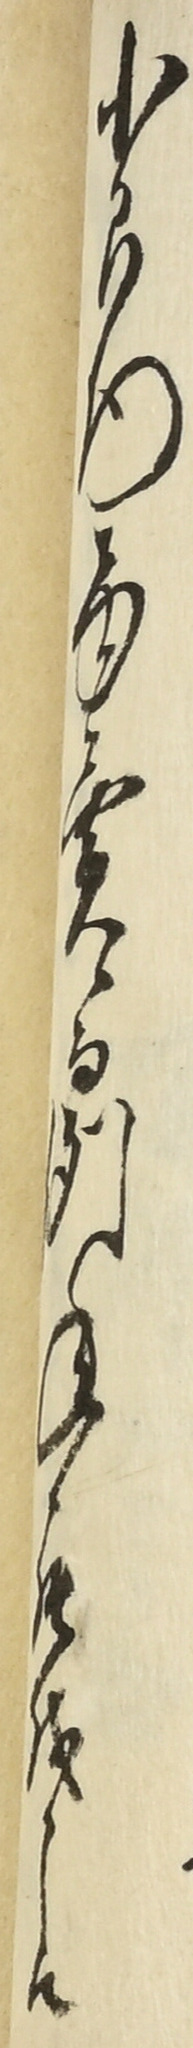絹商売ニ而例年罷越申候
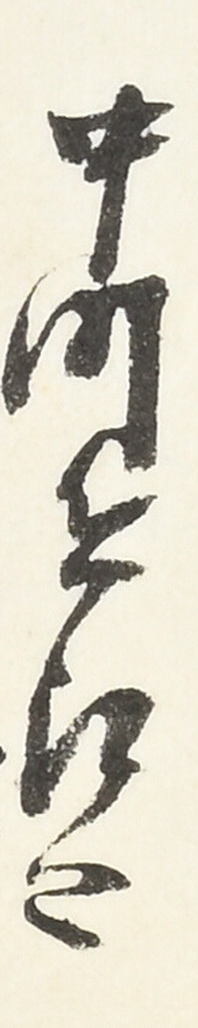中町近江や
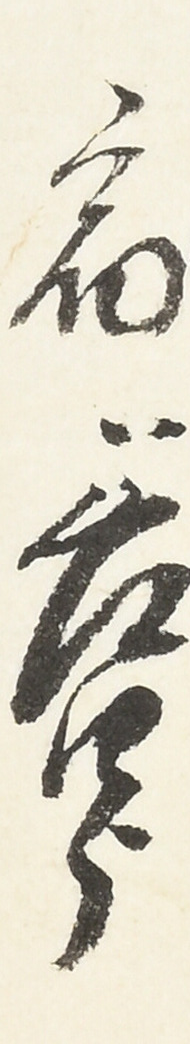宿善四郎
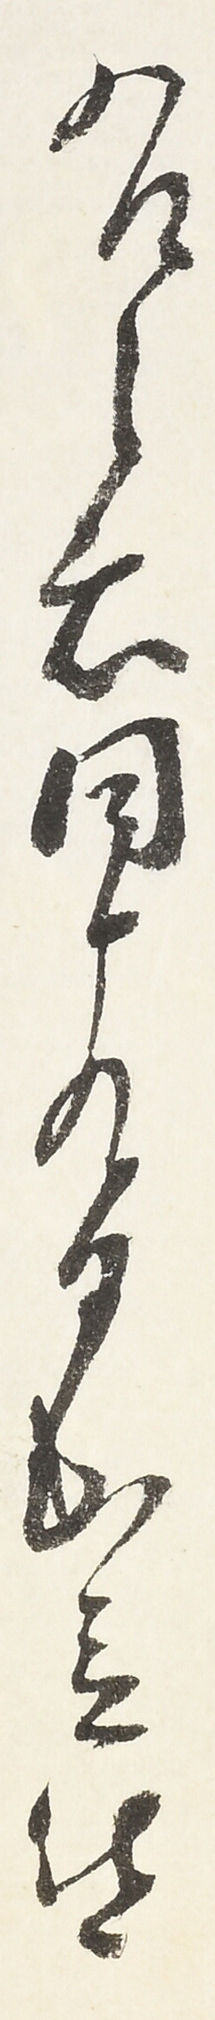右之者同十九日出立仕候
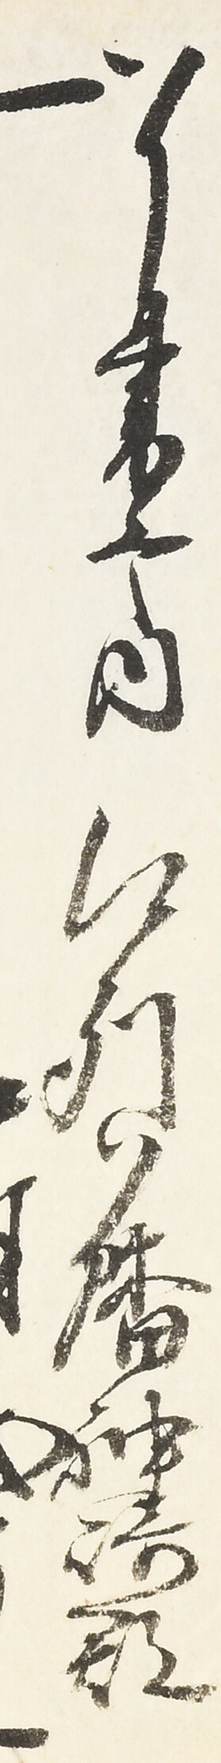八月書上之内江州八幡神崎郡
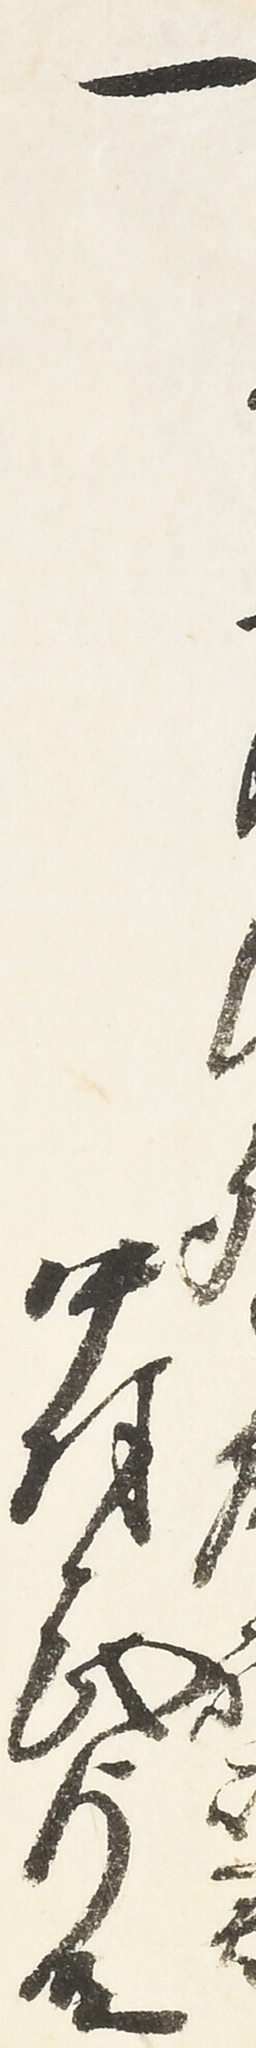一中村武衛門殿
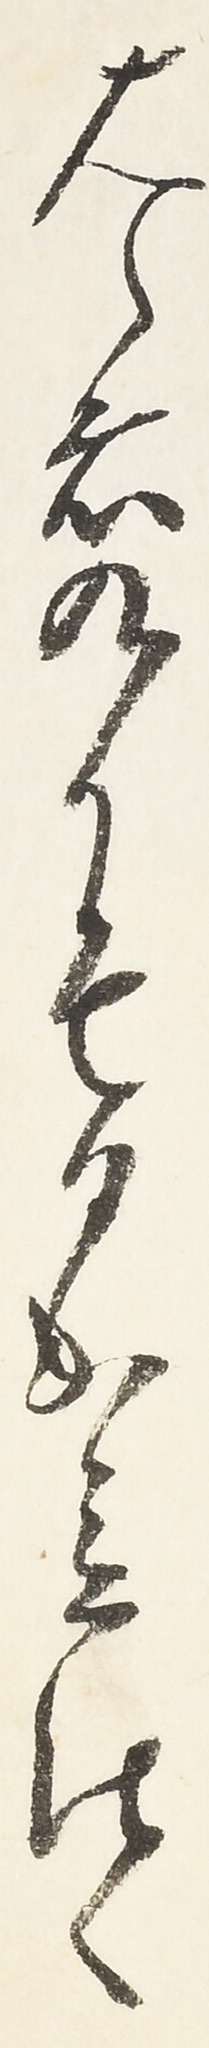右之者九月七日出立仕候
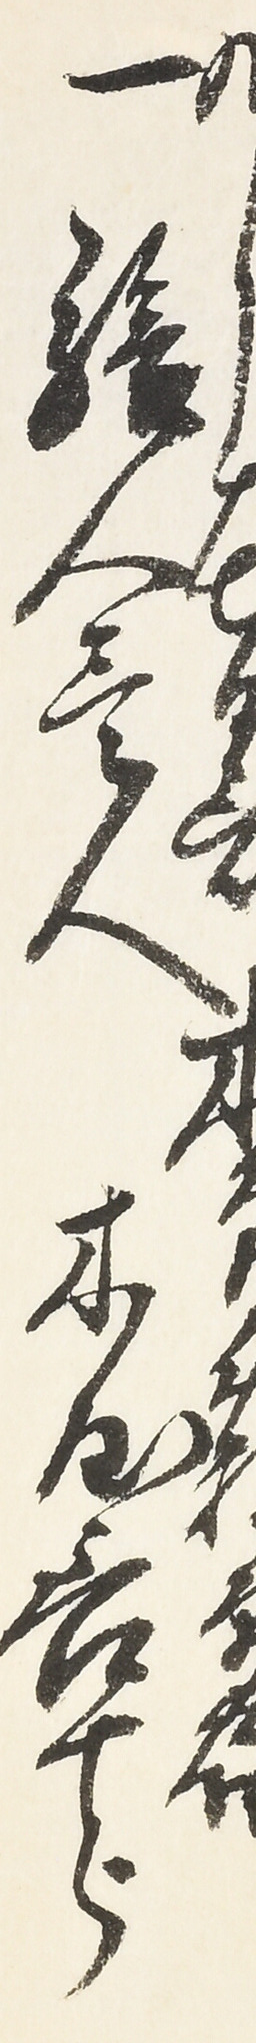一旅人壱人木屋善十郎
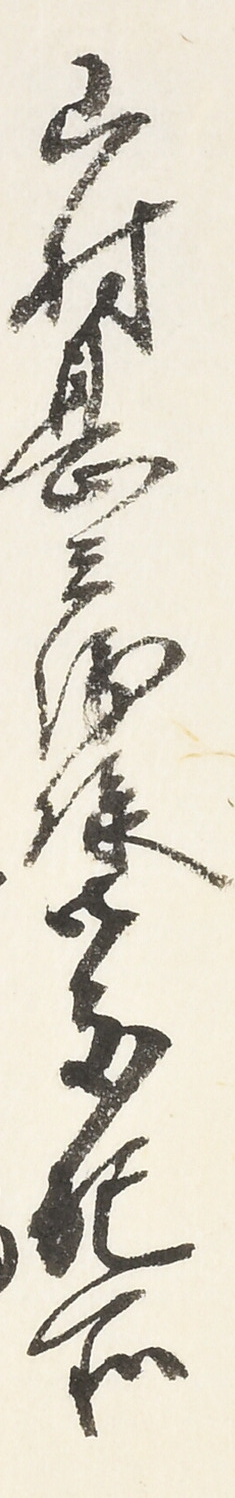山村甚兵衛様御支配所
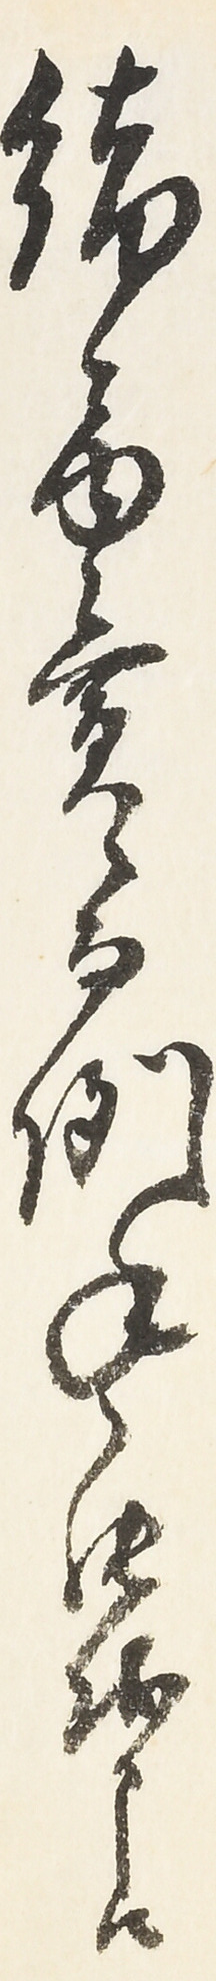絹商売ニ而例年罷越申候
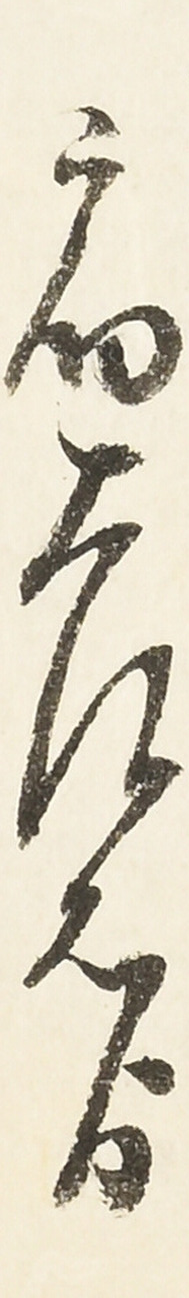宿吉右衛門
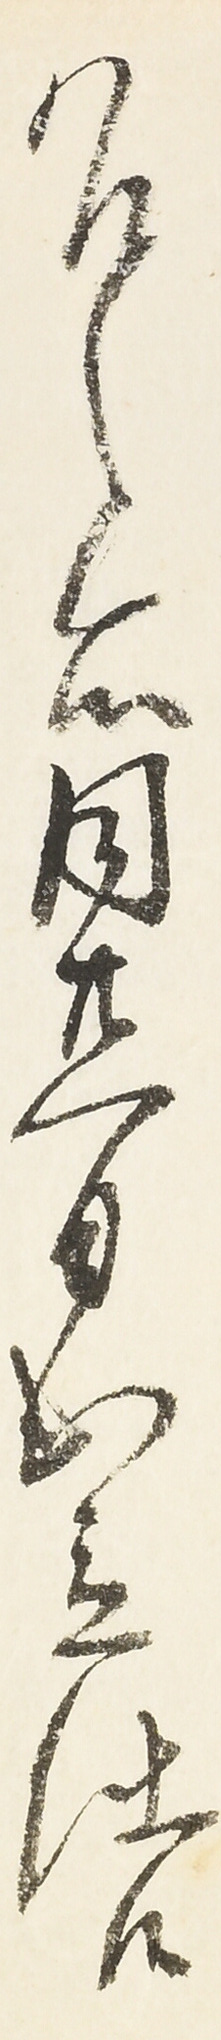右之者同廿一日出立仕候
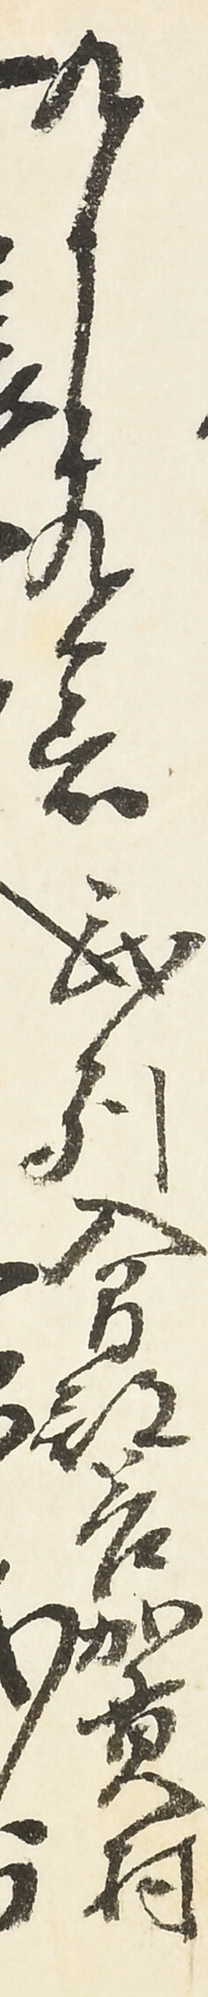九月十九日着武州入間郡谷加貫村
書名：町中旅人泊控帳
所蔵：伊那市立高遠町図書館・合同会社AMANE
